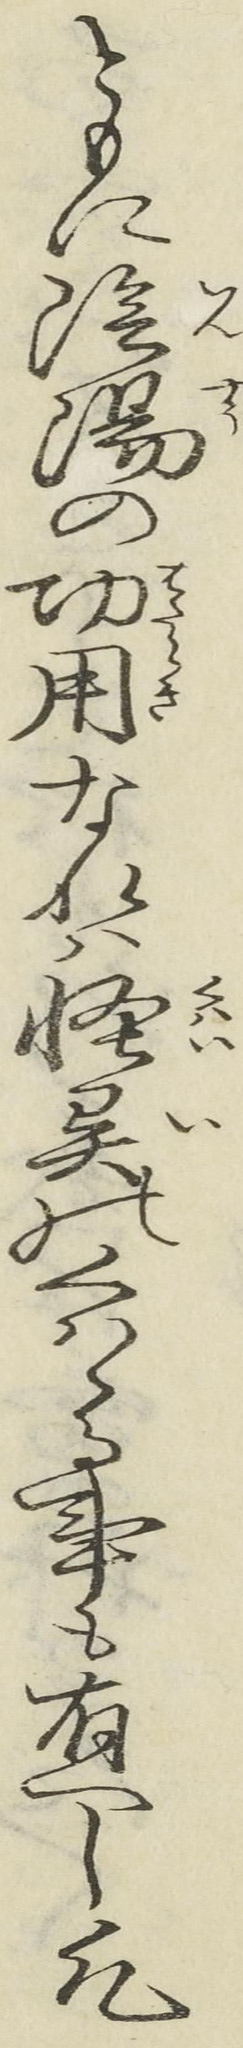ともに陰陽の功用なれは怪異のくはゝる事も有へし凡
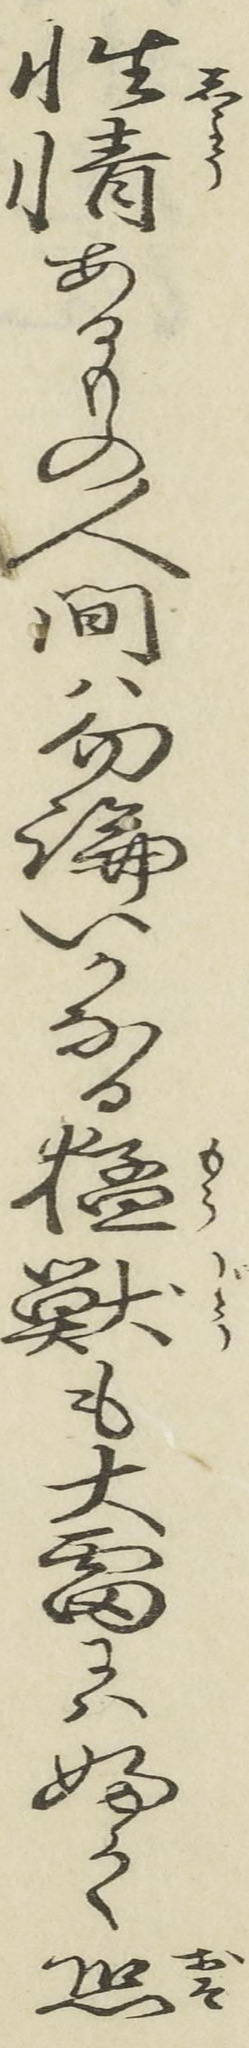性情あるもの人間は勿論いかなる猛獣も大雷にはふかく恐
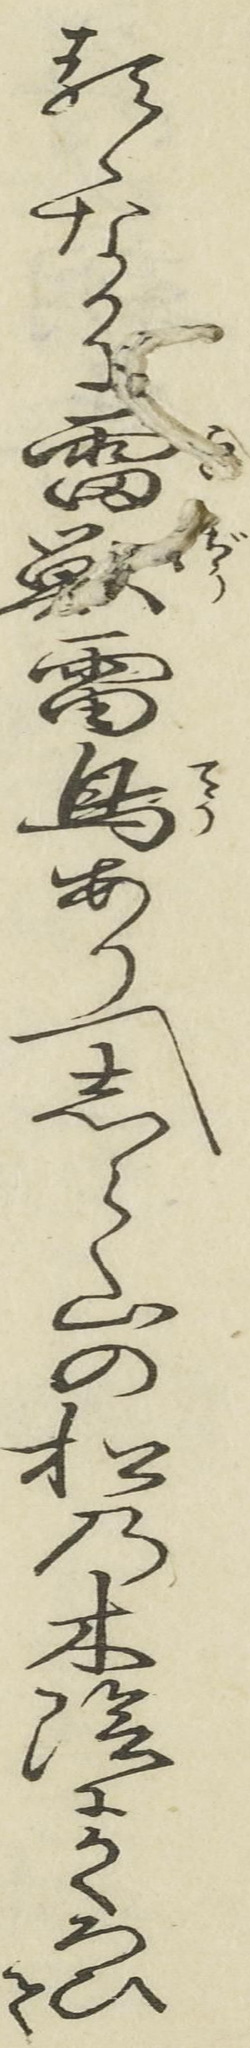るゝなかに雷獣雷鳥あり「しら山の松の木陰にかくろひて
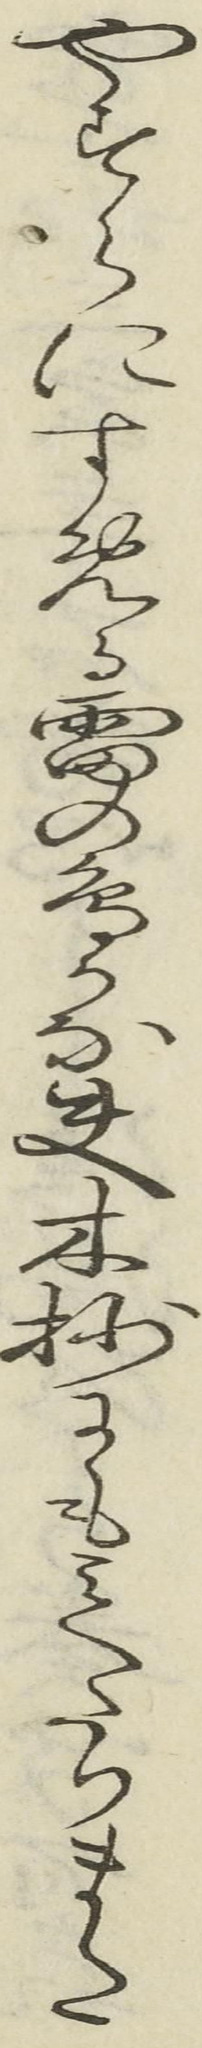やすらにすめる雷の鳥かな夫木抄にもみへたりまた
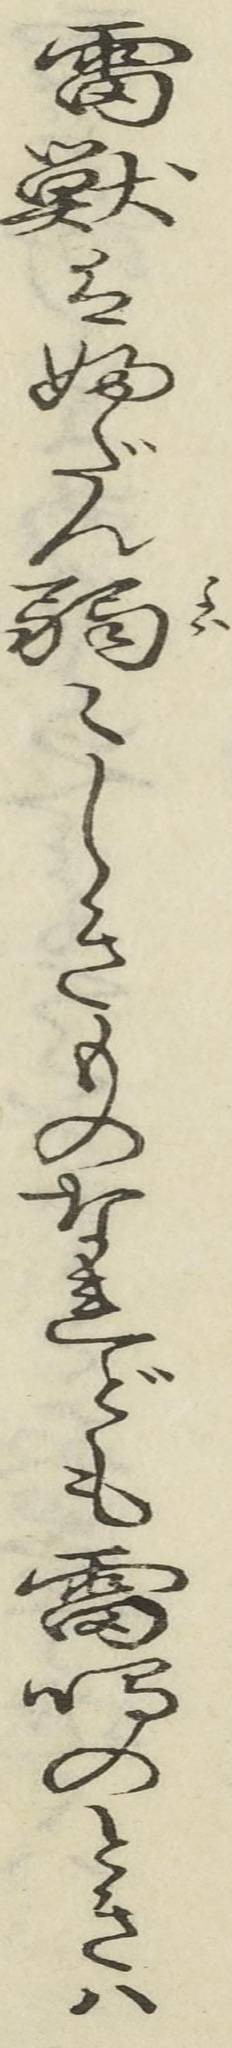雷獣はふだん弱々しきものなれども雷鳴のときは
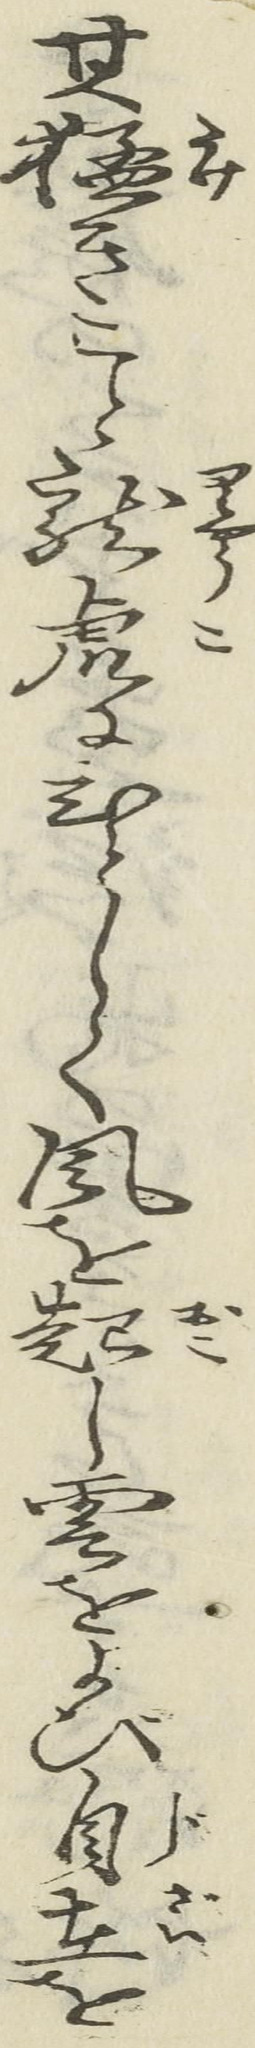其猛きこと龍虎にひとしく風を起し雲をよび自在を
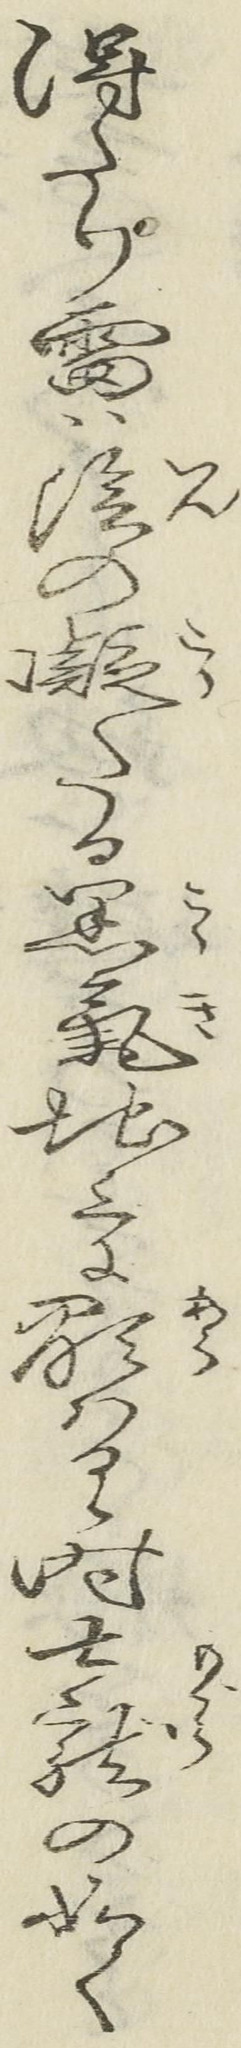得たり雷は陰の凝たる黒気地上に顕はるゝ時土龍の如く
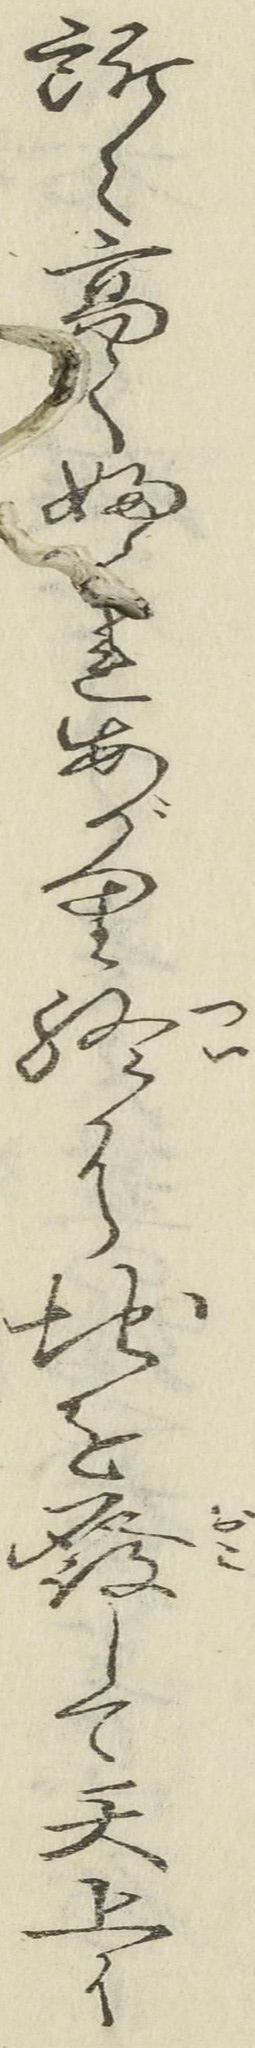所々高くふくれあがり終に地を發して天上に
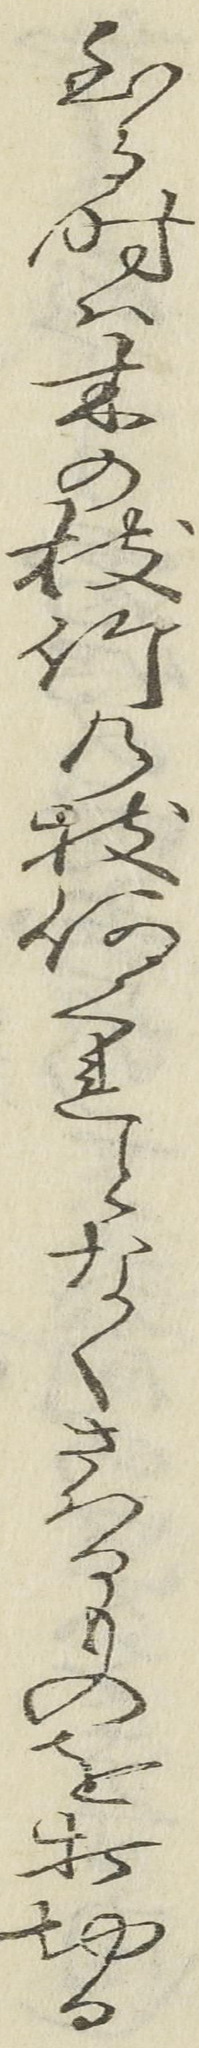至る時は木の枝竹の枝何くれとなくさわるものを打切る
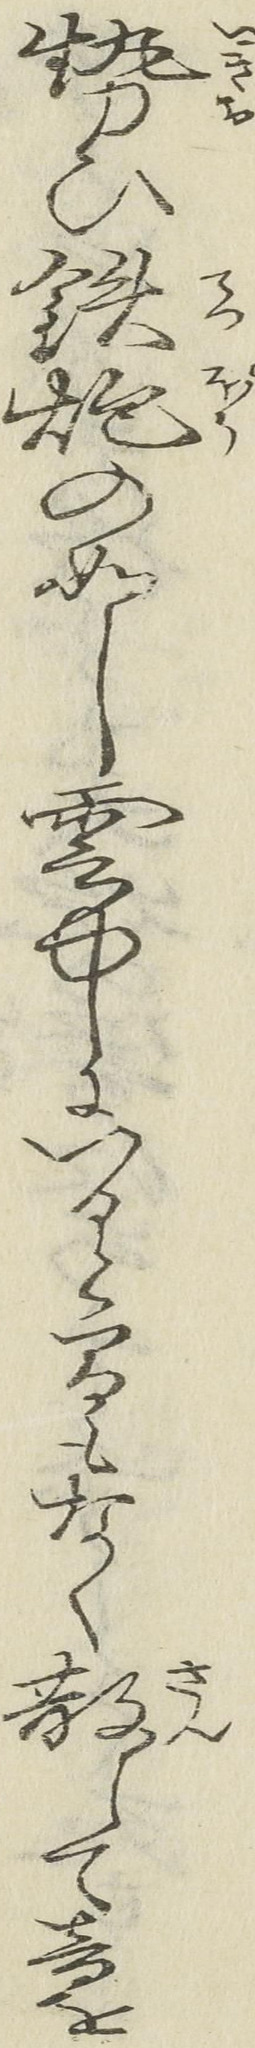勢ひ鉄砲の如し雲中にいると間もなく散して音を
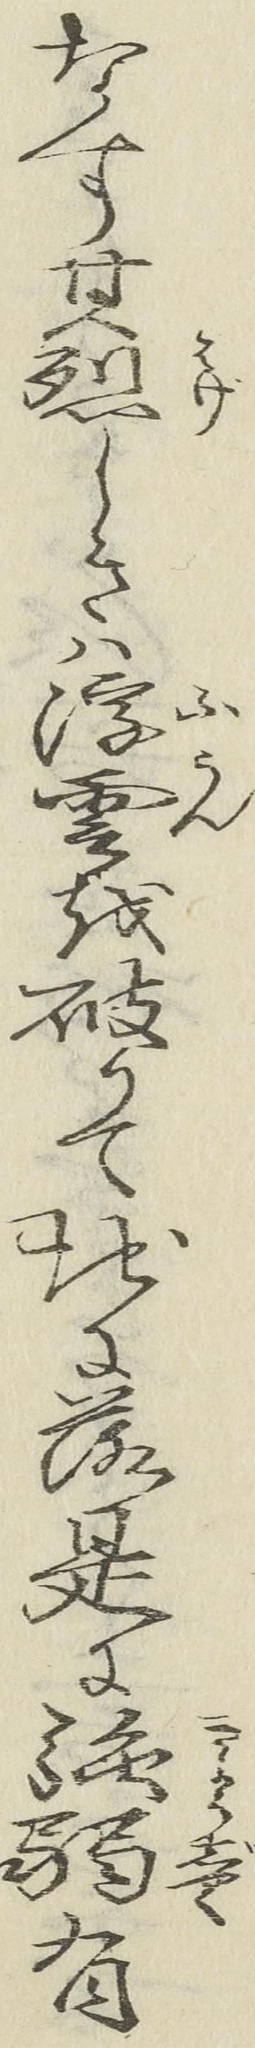なす其烈しきは浮雲を破りて地に落是に強弱有
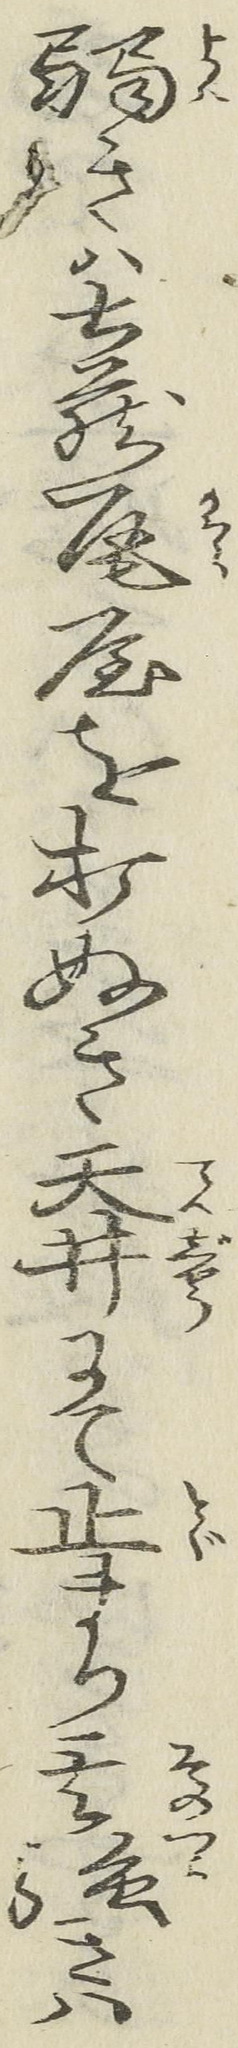弱きは土蔵瓦屋を打ぬき天井にて止まり其強きはの
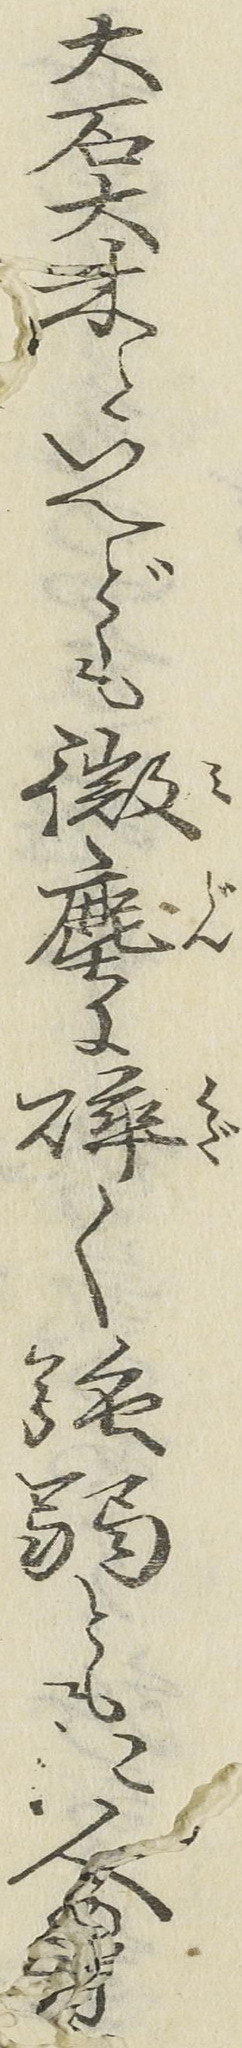大石大木といへども微塵に砕く強弱ともに人の背
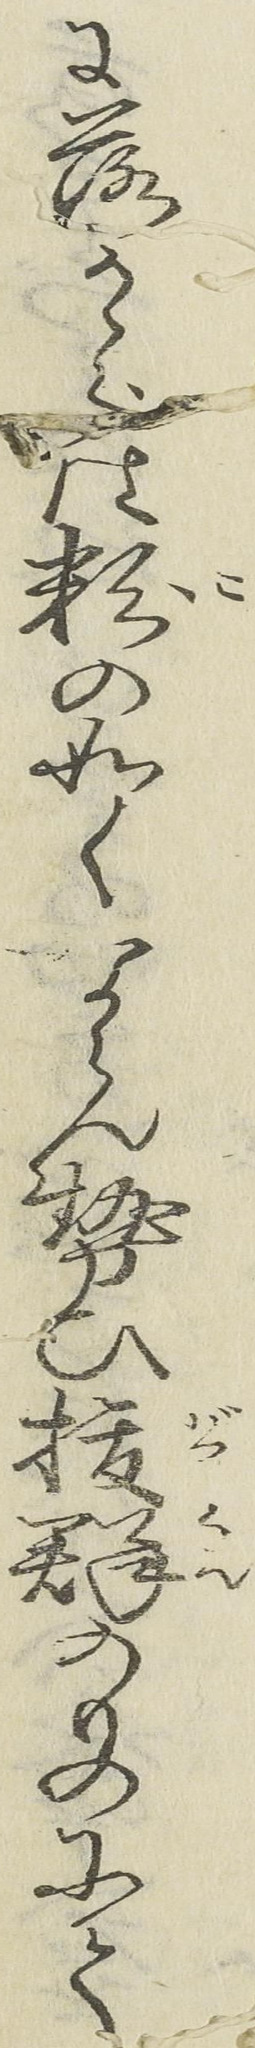に落ちかゝらは粉の如くならん勢ひ抜群のものにて

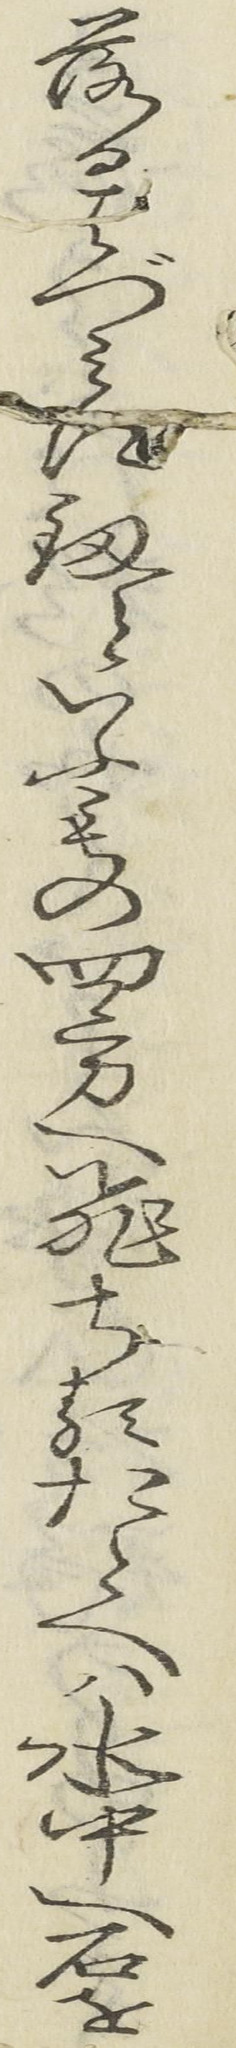落るはづみに釼といふもの四方へ飛ちるたとへは水中へ石を
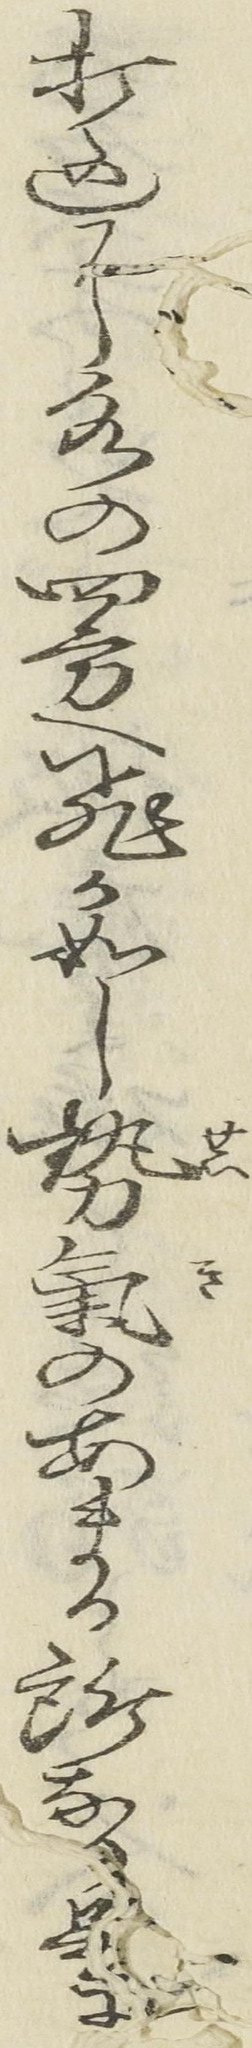打込に水の四方へ飛か如し勢気のあまる所なり是に
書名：震雷考説　全
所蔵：東京大学地震研究所図書室 Earthquake Research Institute Library, The University of Tokyo, JAPAN
